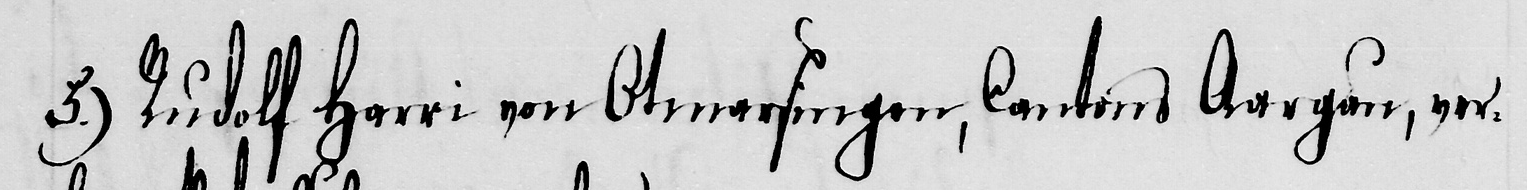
5.) Rudolf Harri von Otmarsingen, Cantons Aargau, ver¬
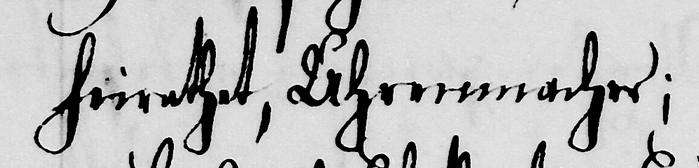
heirathet, Uhrenmacher;
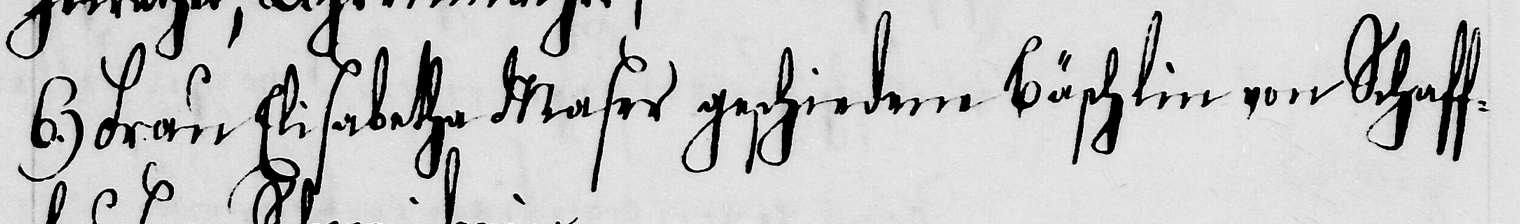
6.) Frau Elisabetha Maser geschiedene Bäschlin von Schaff¬
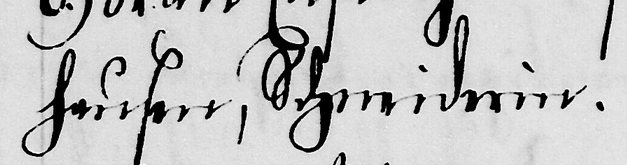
hausen, Schneiderin.
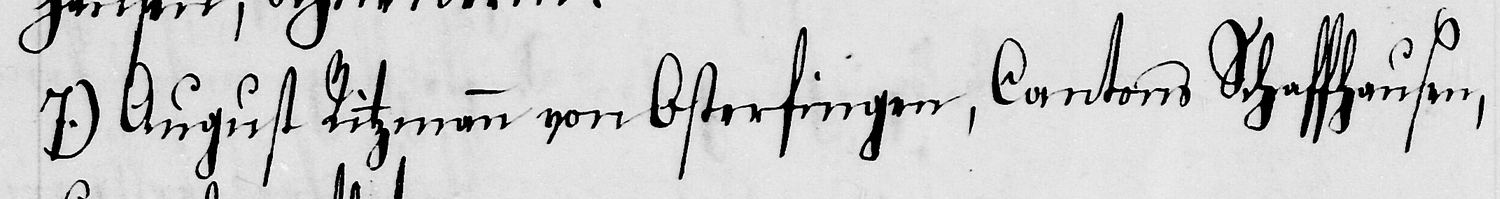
7.) August Ritzmann von Osterfingen, Cantons Schaffhausen,
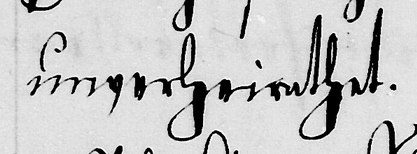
unverheirathet.
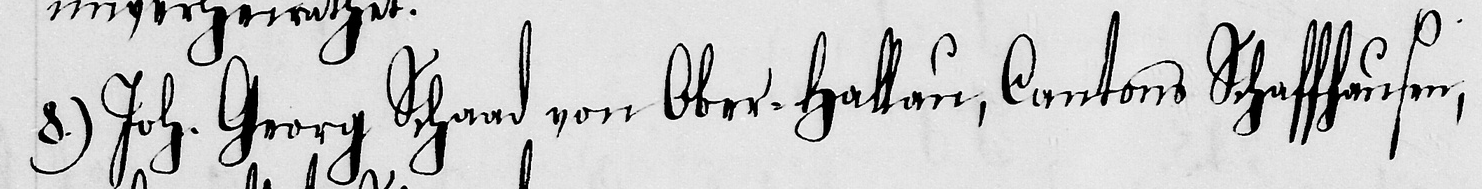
8.) Joh. Georg Schaad von Ober-Hallau, Cantons Schaffhause¬
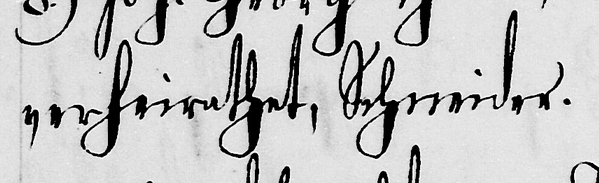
verheirathet, Schneider.
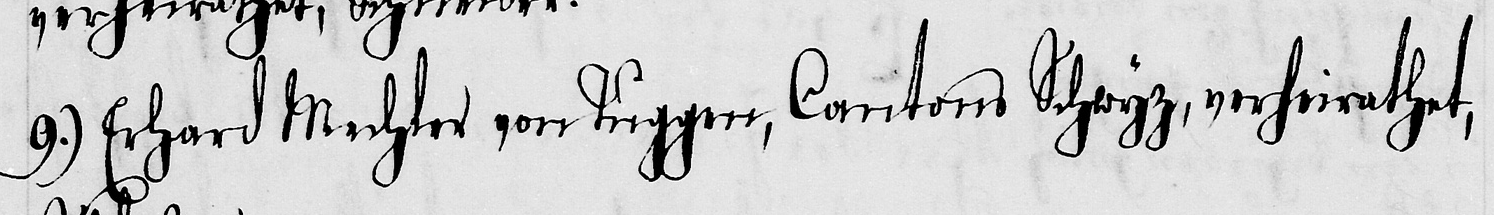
9.) Erhard Mechler von Tuggen, Cantons Schwyz, verheirathet,
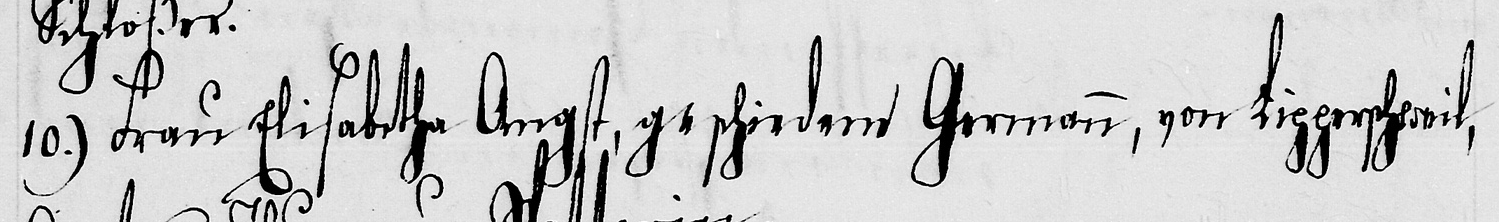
10.) Frau Elisabetha Angst, geschiedene Germann, von Lippen¬
